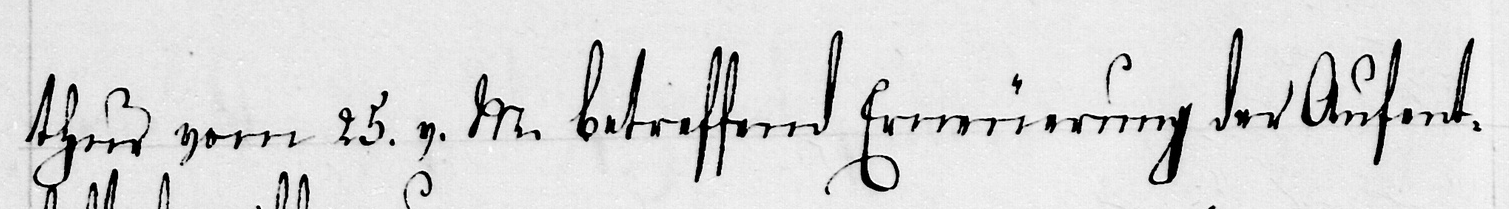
thur vom 25. v. M. betreffend Erneuerung der Aufent¬
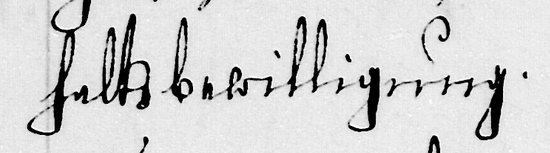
haltsbewilligung.
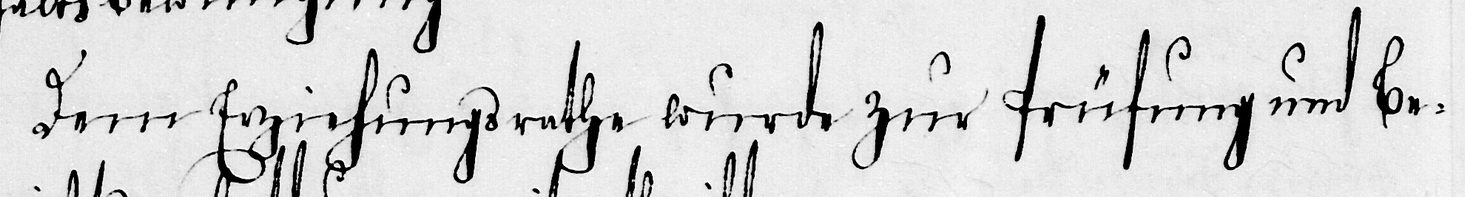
Dem Erziehungsrathe wurde zur Prüfung und Be¬
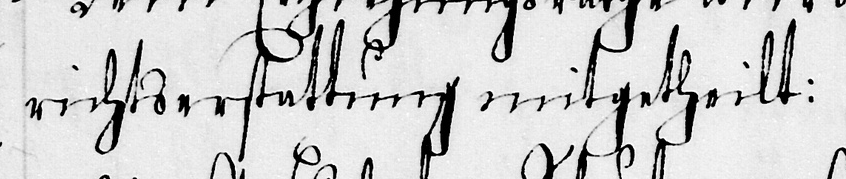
richtserstattung mitgetheilt:
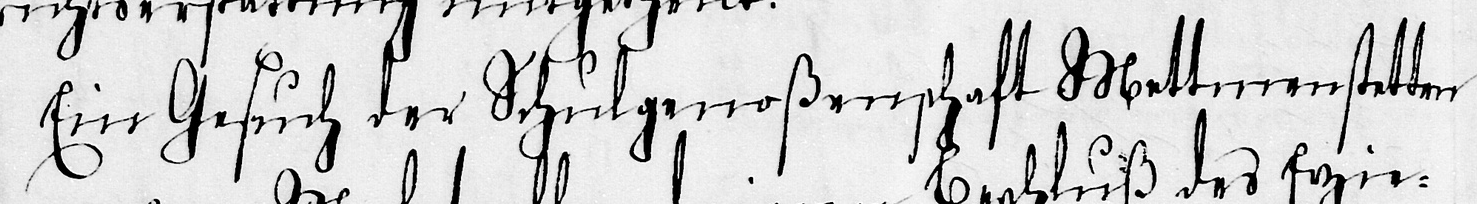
Ein Gesuch der Schulgenoßenschaft Mettmenstetten
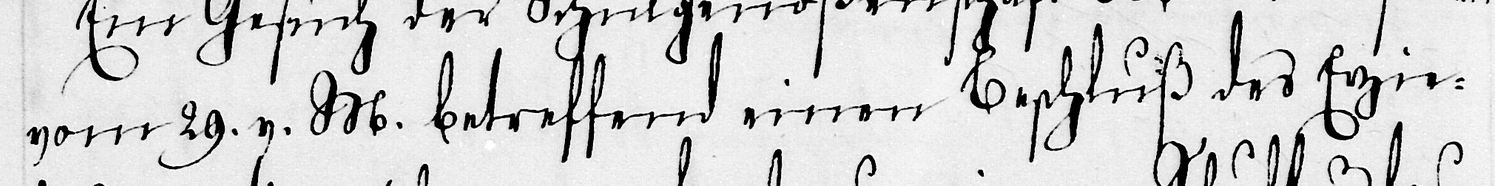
vom 29. v. M. betreffend einen Beschluß des Erzie¬
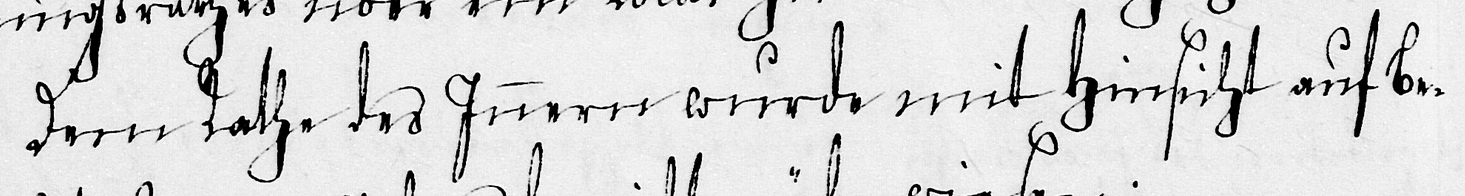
Dem Rathe des Innern wurde mit Hinsicht auf Be¬
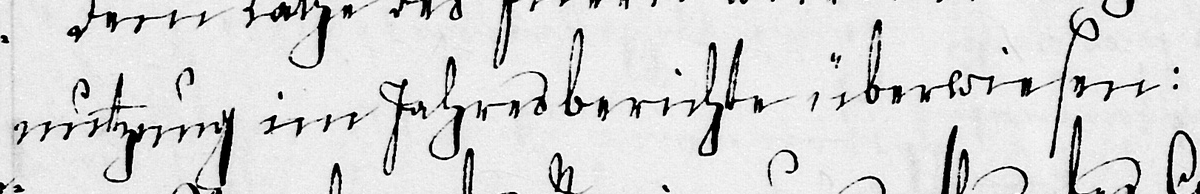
nutzung im Jahresberichte überwiesen:
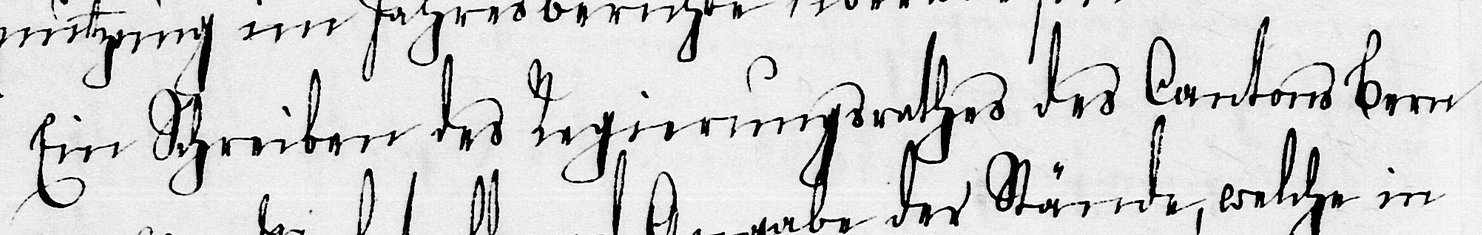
Ein Schreiben des Regierungsrathes des Cantons Bern
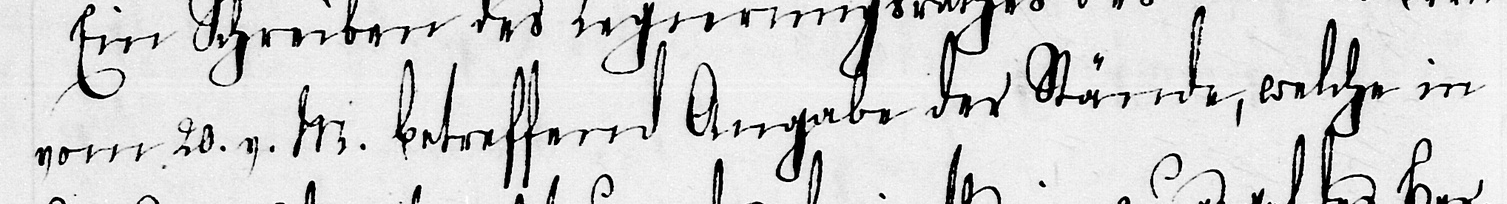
vom 20. v. M. betreffend Angabe der Stände, welche in
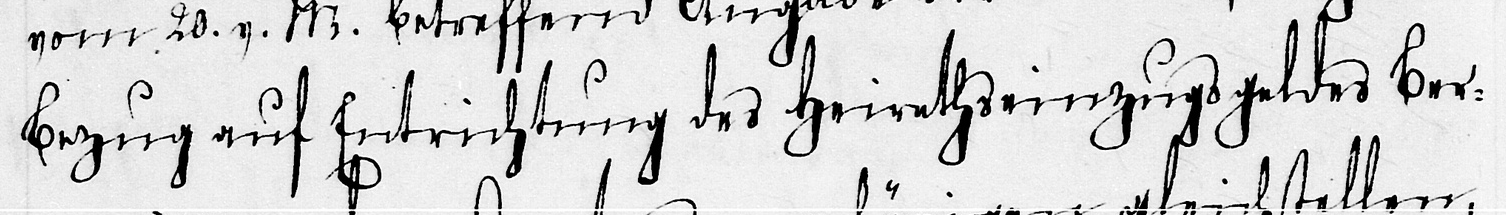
Bezug auf Entrichtung des Heirathseinzugsgeldes Ber¬
